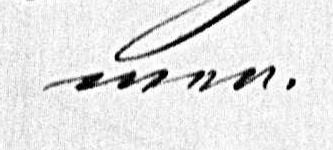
men.
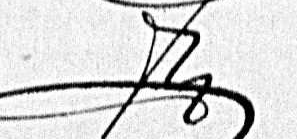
FJ
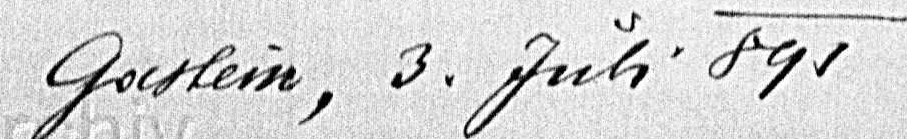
Gastein, 3 Juli 1891
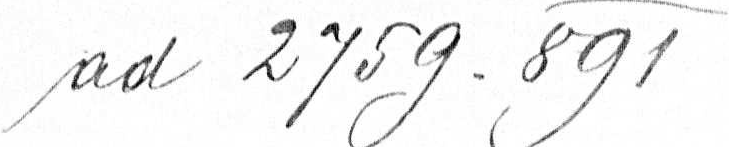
ad 2759 - 1891
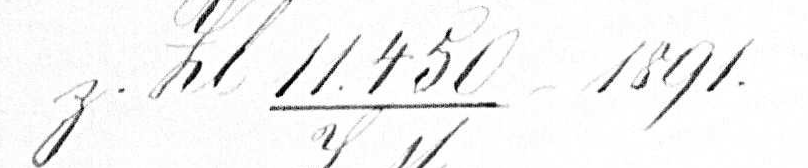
z. Zl 11.450/ 1891.
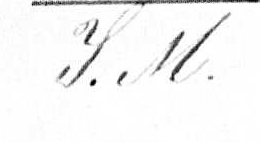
J. M.
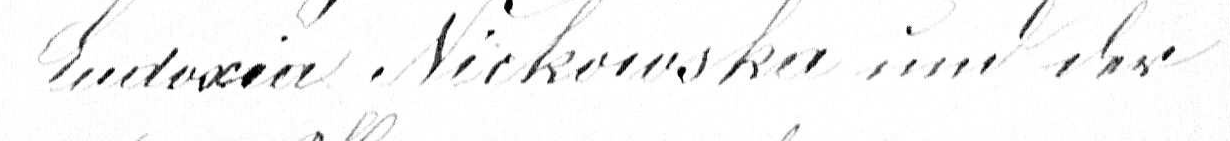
Eudoxia Nickowska und der
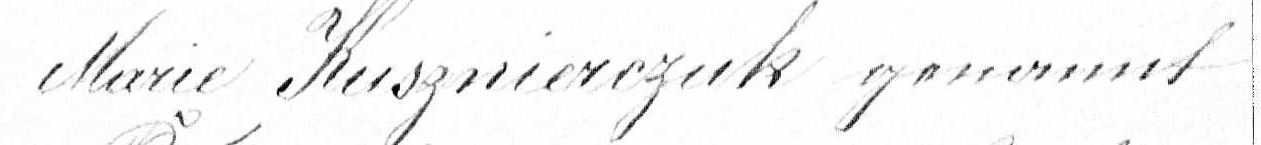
Marie Kusznierczuk genannt
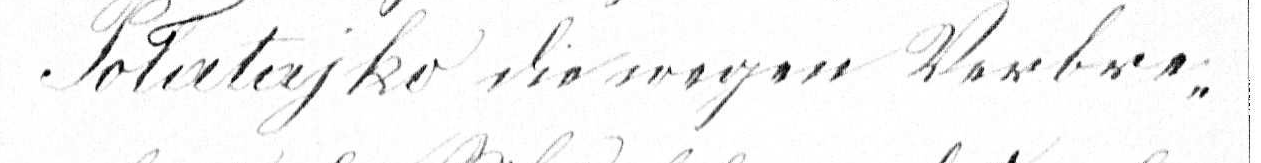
Połatajko, die wegen Verbre¬
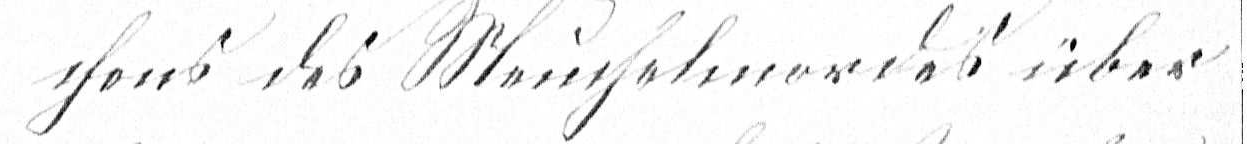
chens des Meuchelmordes über
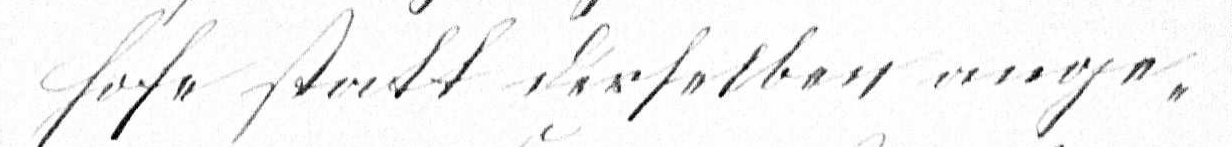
hofe, statt derselben ange¬
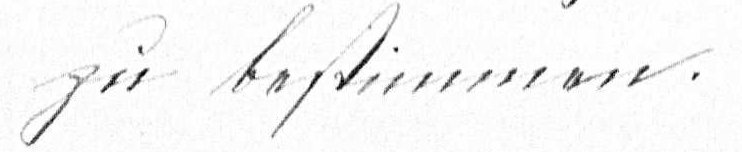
zu bestimmen.
